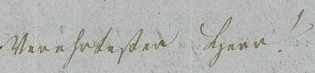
Verehrtester Herr!
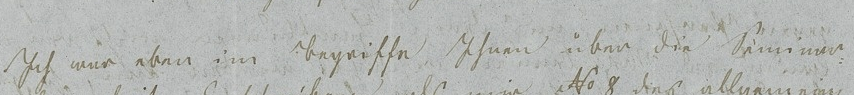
Ich war eben im Begriffe, Ihnen über die Seminar-
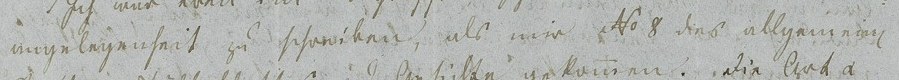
Angelegenheit zu schreiben, als mir No 8 des allgmeinen
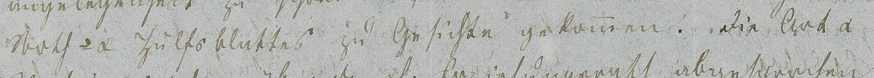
Noth- & Hülfsblattes zu Gesichte gekommen. Die Art &
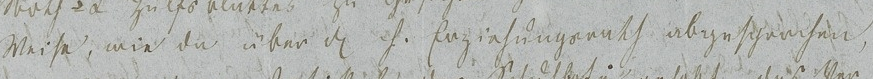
Weise, wie da über den h. Erziehungsrath abgesprochen,
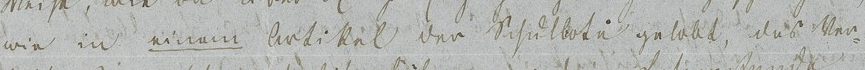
wie in einem Artikel der Schulbote gelobt, das Ver-
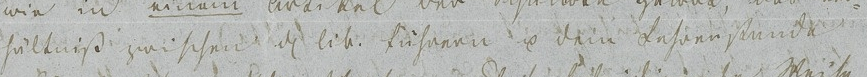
hältniß zwischen den lib. Führern & dem Lehrerstande
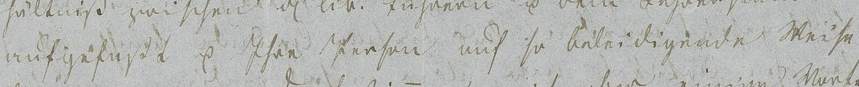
aufgefaßt & Ihre Person auf so beleidigende Weise
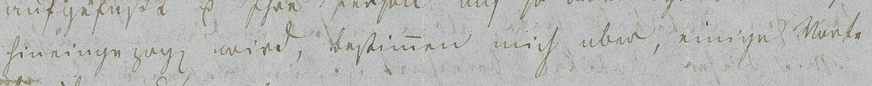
hineingezogen wird, bestimmen mich aber, einige Worte
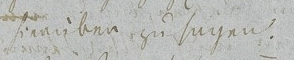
hierüber zu sagen.
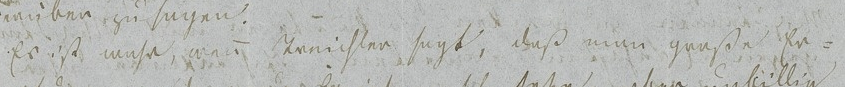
Es ist wahr, wenn Treichler sagt, daß man große Er-
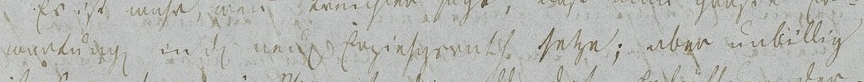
wartungen in den neuen Erziehungsrath setze; aber unbillig
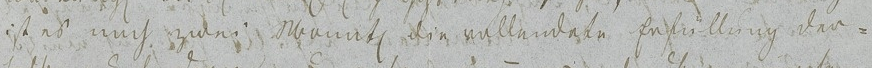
ist es nach zwei Monaten die vollendete Erfüllung der-
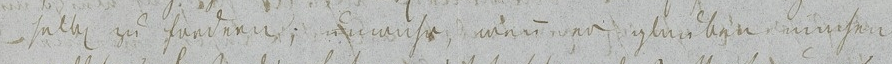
selben zu fordern; unwahr, wenn er glauben machen
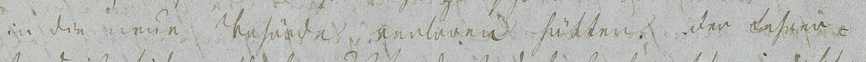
in die neue Behörde verloren hätten. Der Lehrer-
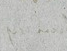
stand
